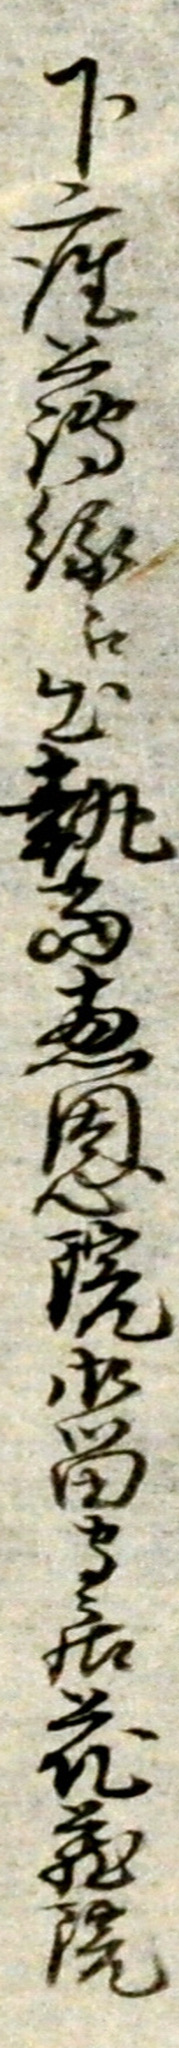下座薄縁江出執当恵恩院御留守居花蔵院
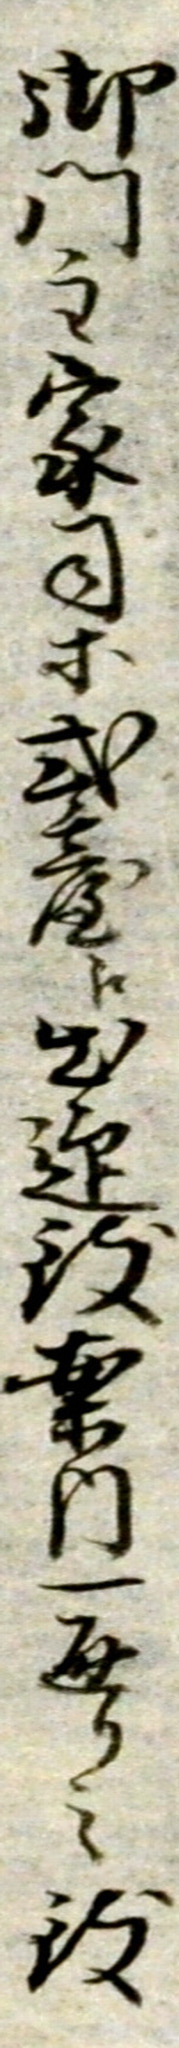御門主家司等式台江出迎致案内一通り之致
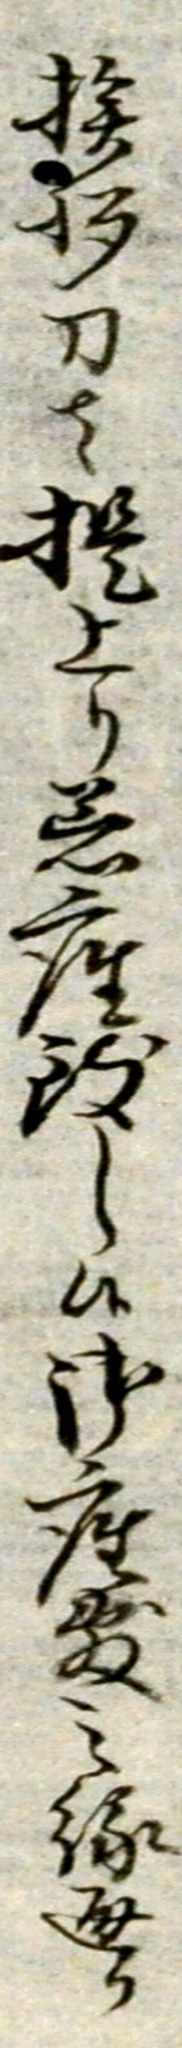挨拶刀者摺上り着座致し候御座敷之縁通り
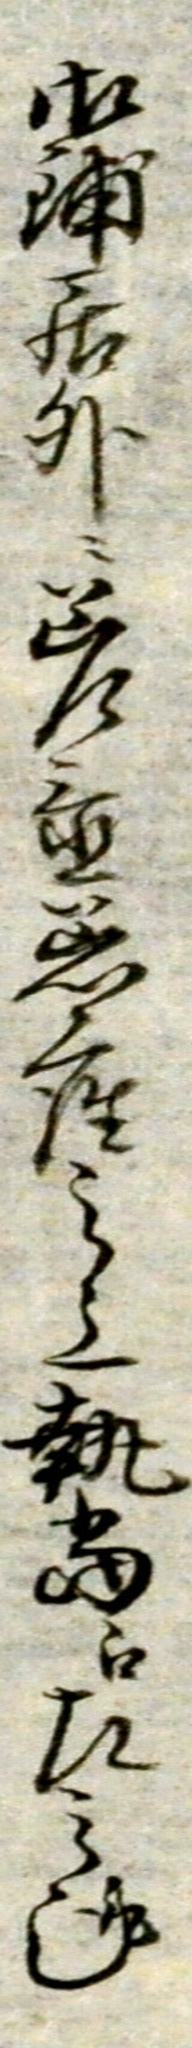御鋪居外ニ差置着座之上執当江左之趣
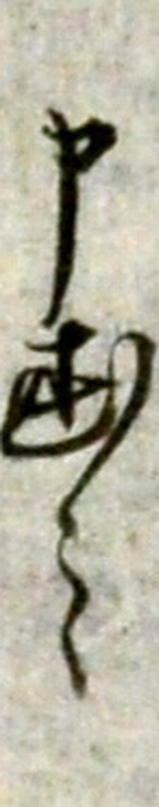申述之
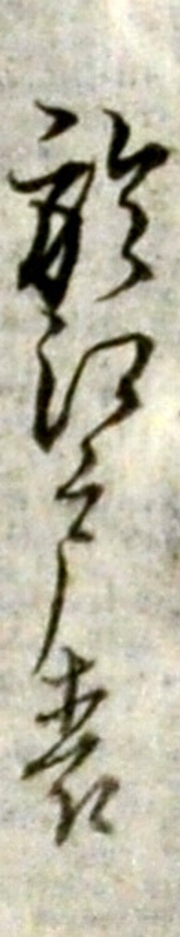於江戸表
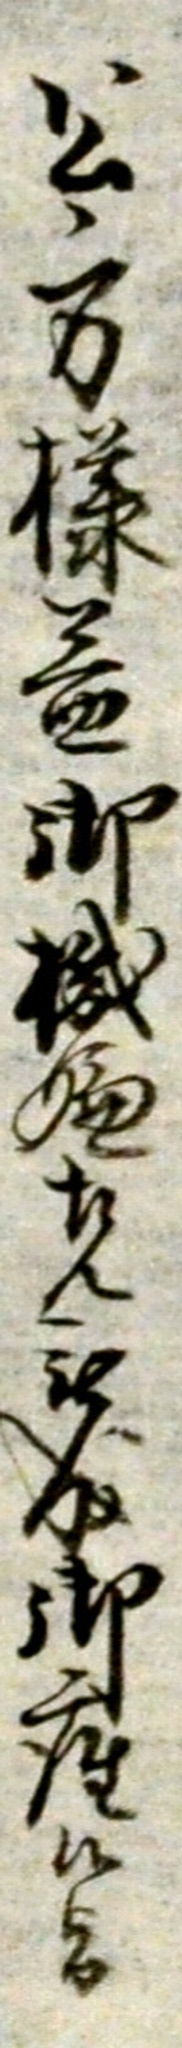公方様益御機嫌克被成御座候旨
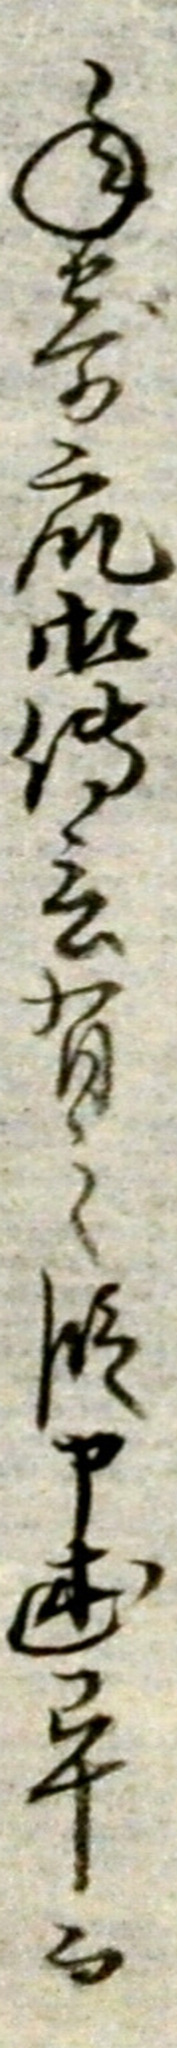年寄衆御伝言有之段申述畢而

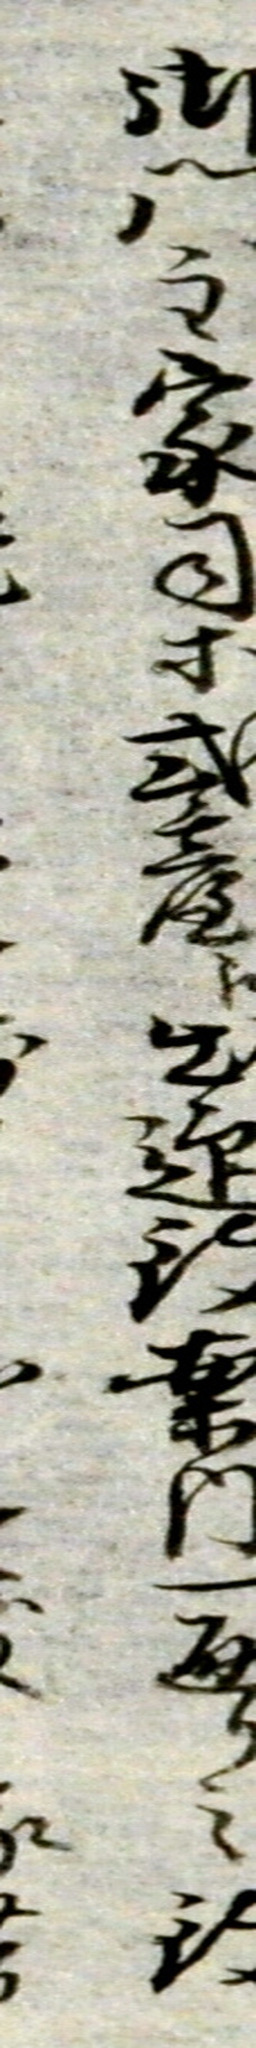御門主家司等式臺江出迎致案内一通り之致
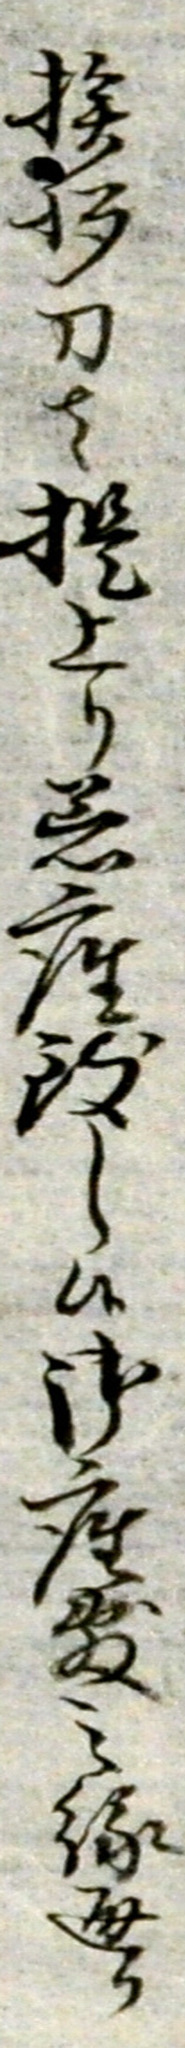挨拶刀者提上り着座致し候御座敷之縁通り
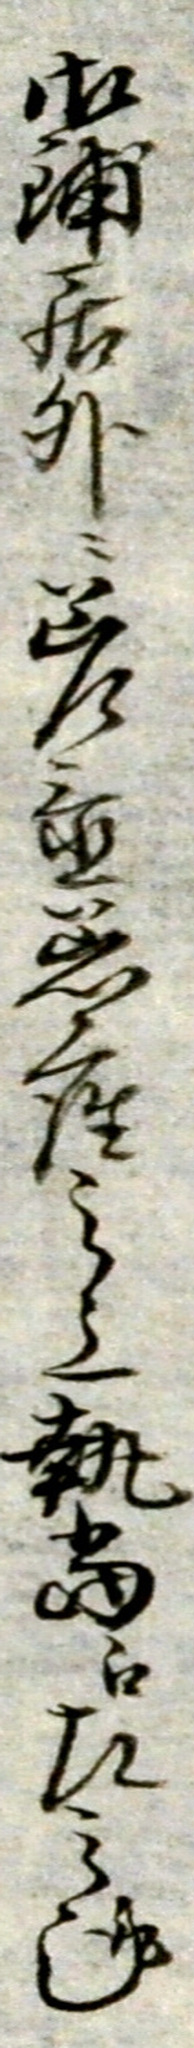御舗居外ニ差置着座之上執當江左之趣
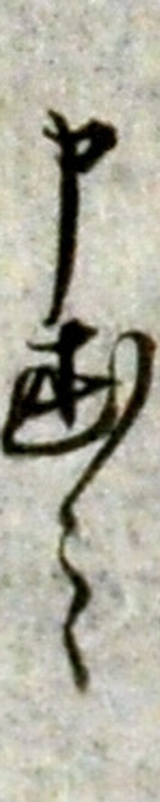申述之
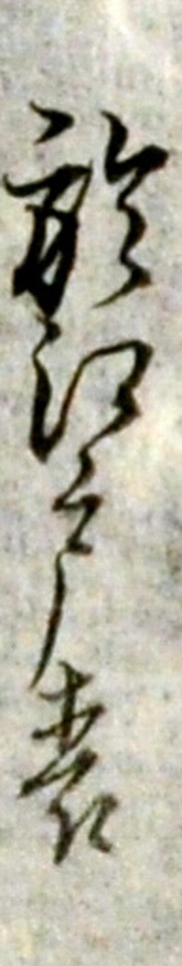於江戸表
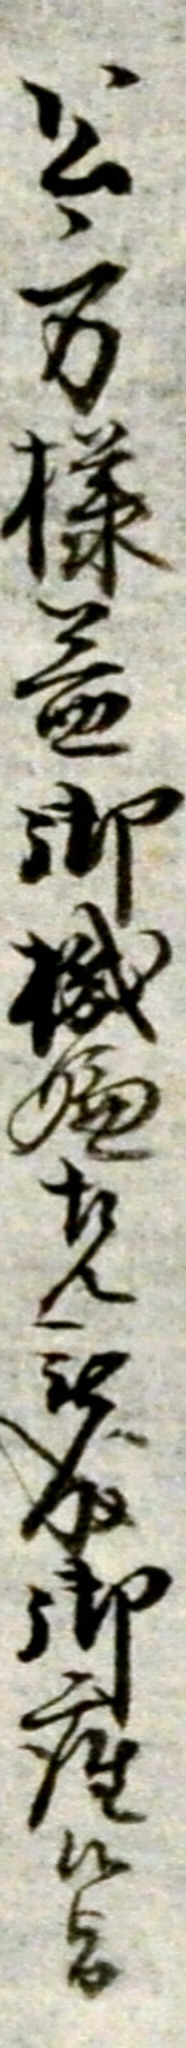公方様益御機嫌克被成御座候旨
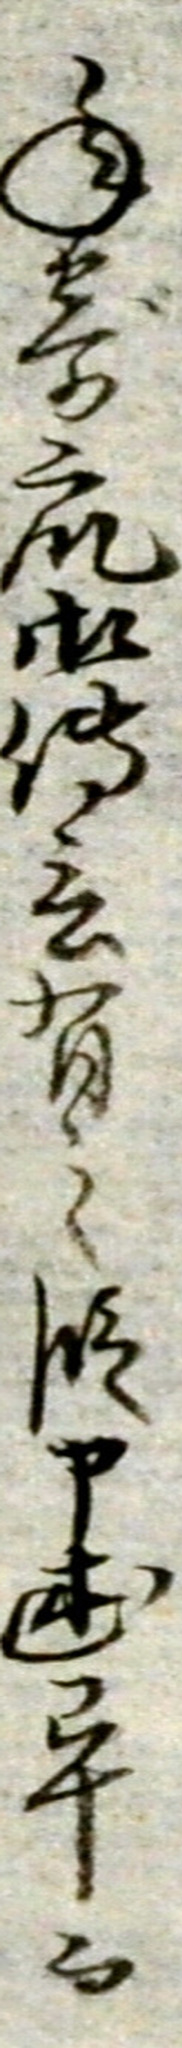年寄衆御伝有之段申述畢而
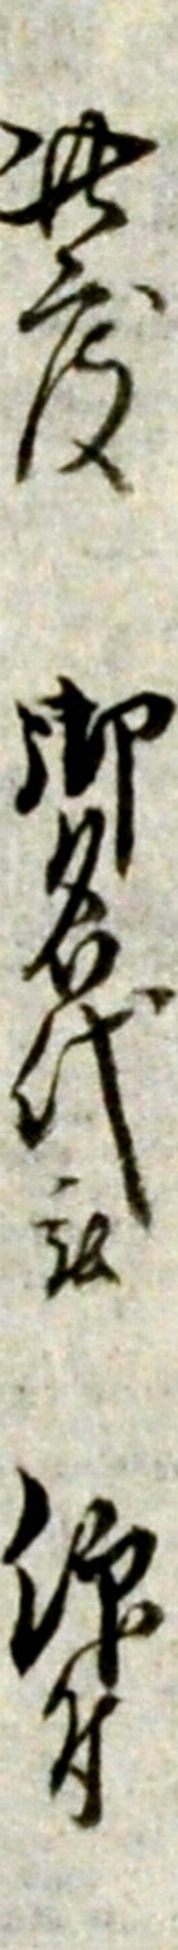此度御名代被仰付
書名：日光御名代相勤候節ノ留
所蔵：伊那市立高遠町図書館・合同会社AMANE
